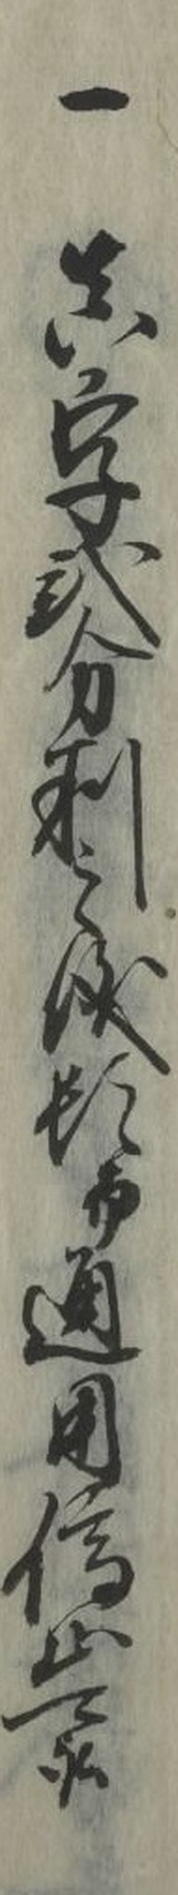一真字弐分判之儀頓而通用停止可被
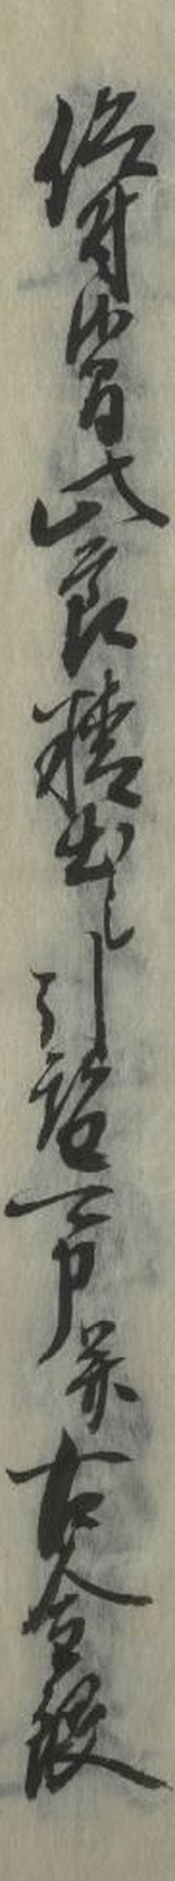仰付候間此節精出し引替可申幷右金銀
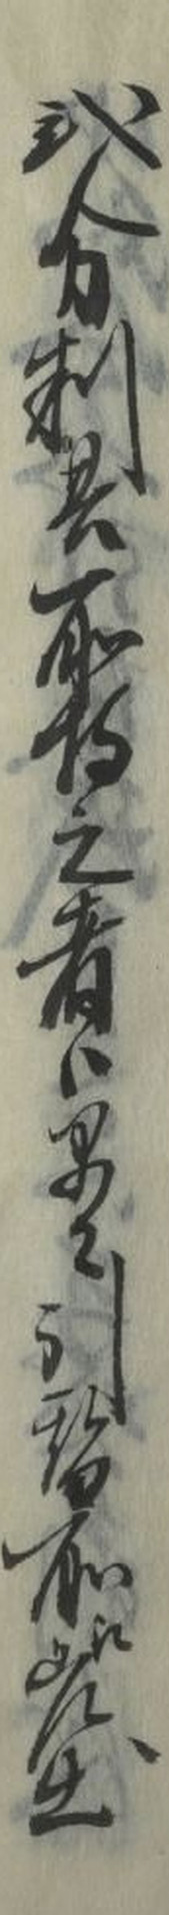弐分判共所持之者は早々引替所え差出
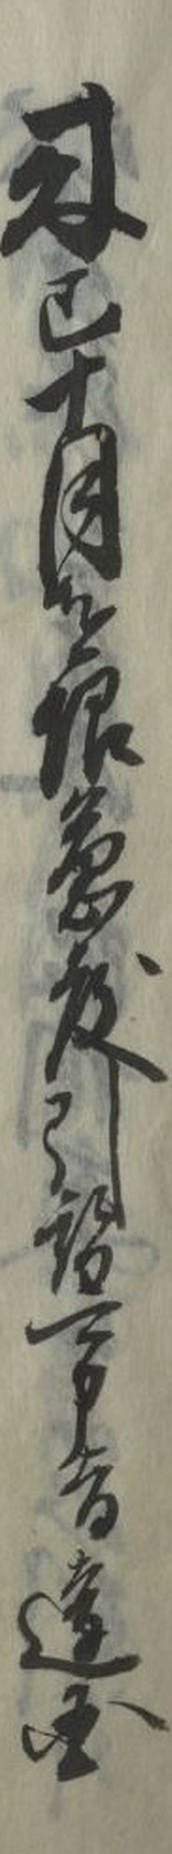来巳十月迄銀急度引替可申旨遠国
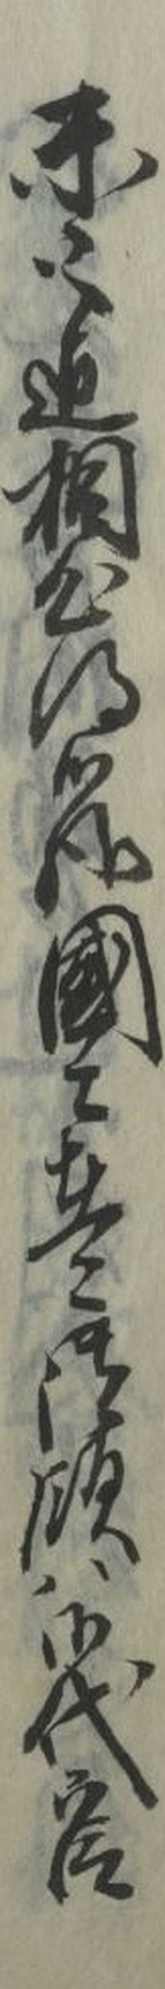末々迄相心得候様国々在々御領は御代官
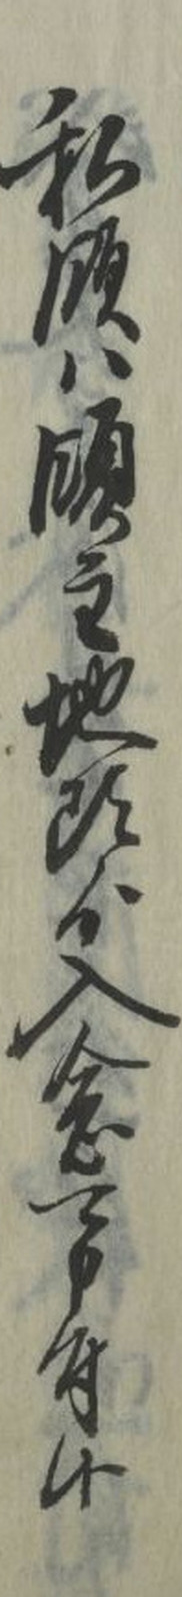私領は領主地頭ゟ入念可申付候
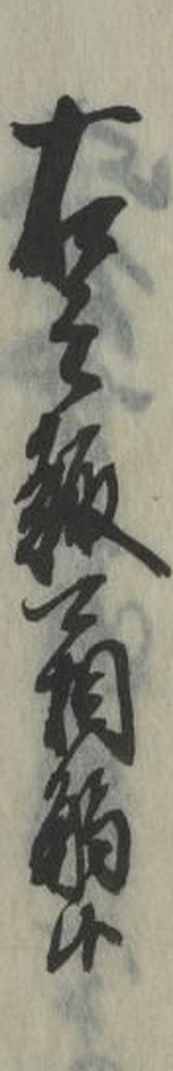右之趣可相触候

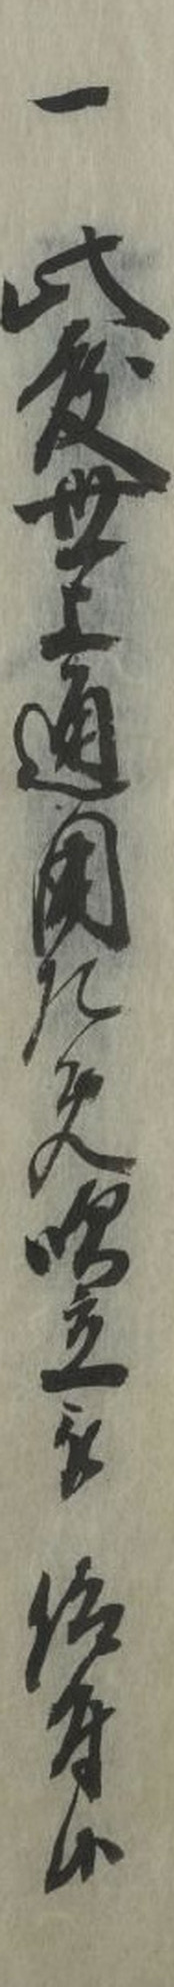一此度世上通用ため吹立被仰付候
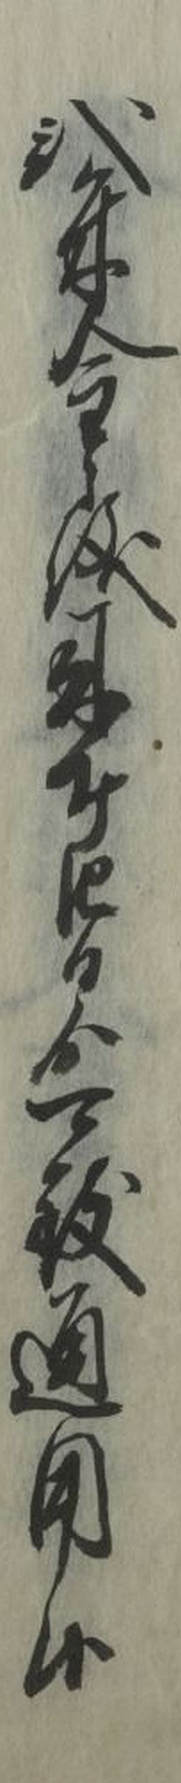弐朱金之儀来廿四日ゟ可致通用候
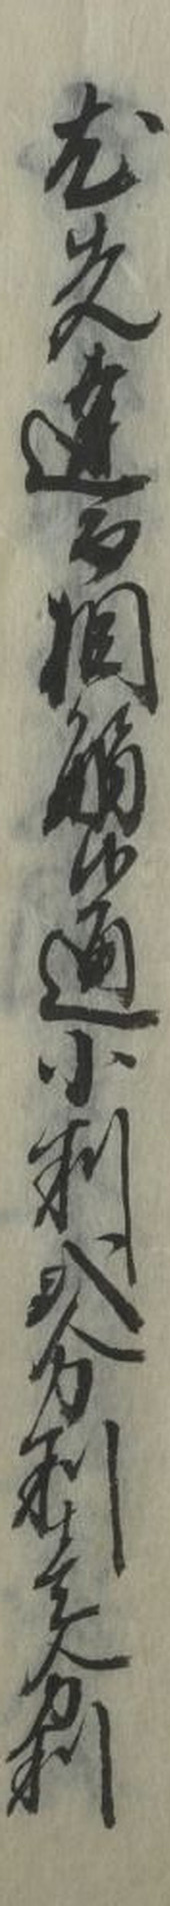尤先達而相触候通小判弐分判壱分判
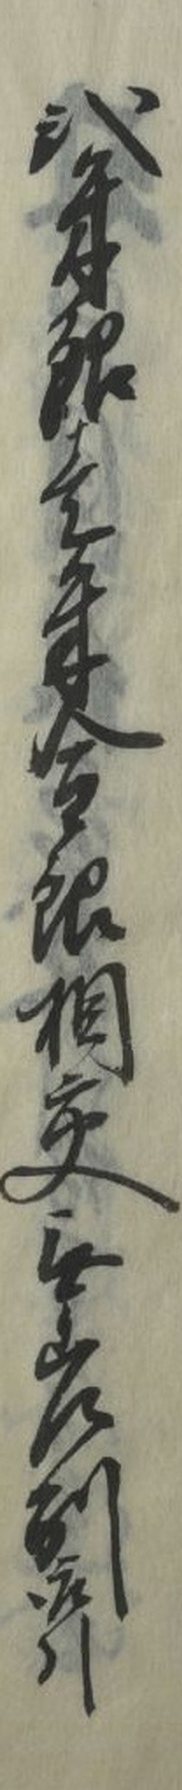弐朱銀壱朱金銀相交無差別取引
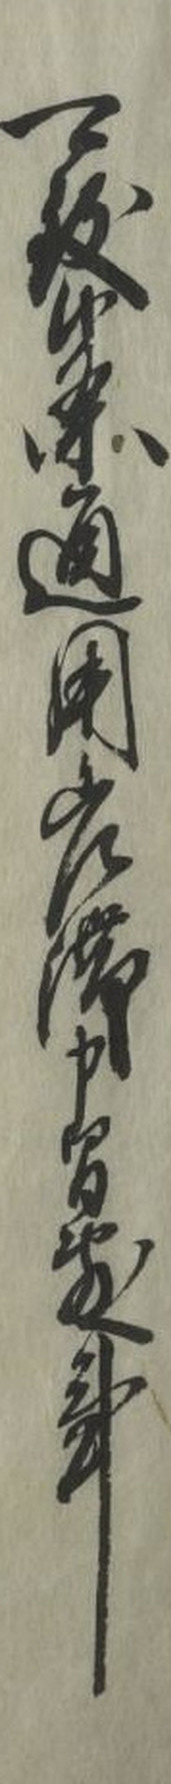可致候条通用差滞申間敷事
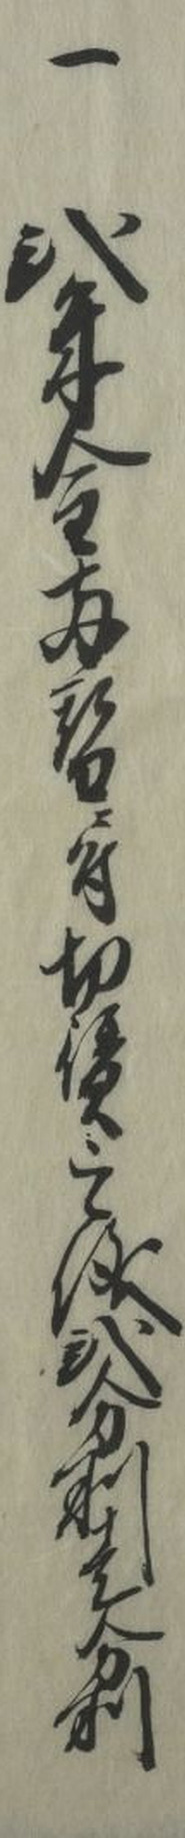一弐朱金両替に付切賃之儀弐分判壱分判
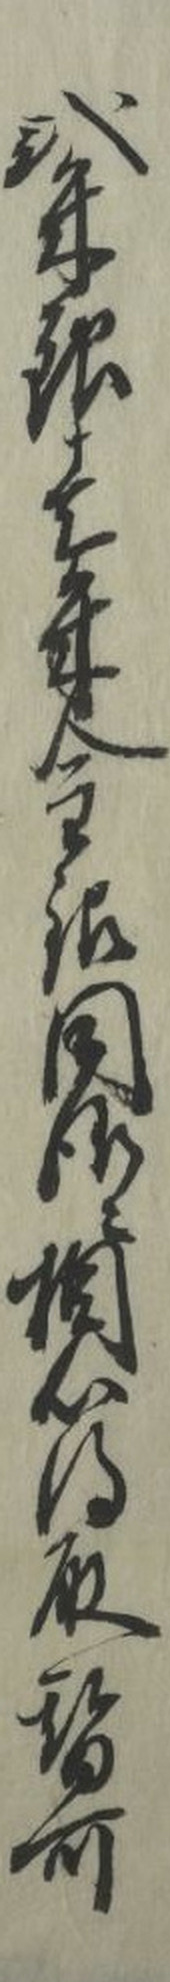弐朱銀壱朱金銀同様に相心得取替可
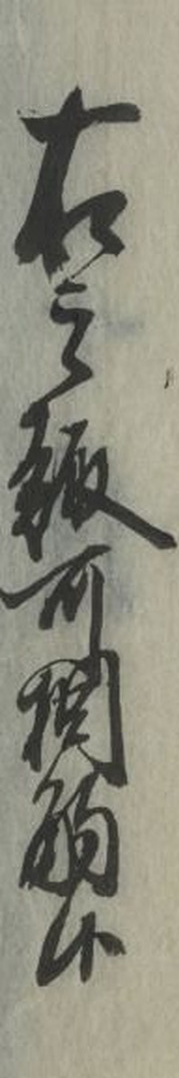右之趣可相触候
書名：天保三壬辰年・琉球人参府・弐朱吹立御触写
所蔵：University of the Ryukyus Library
